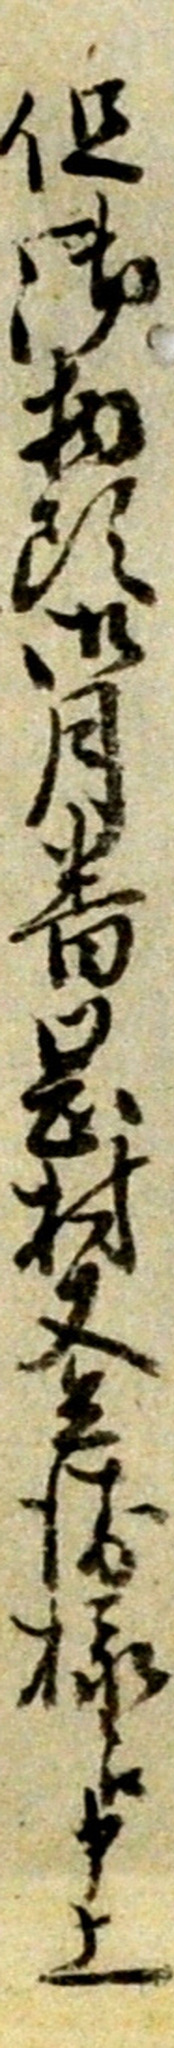但御物頭御月番岡村又兵衛様江申上
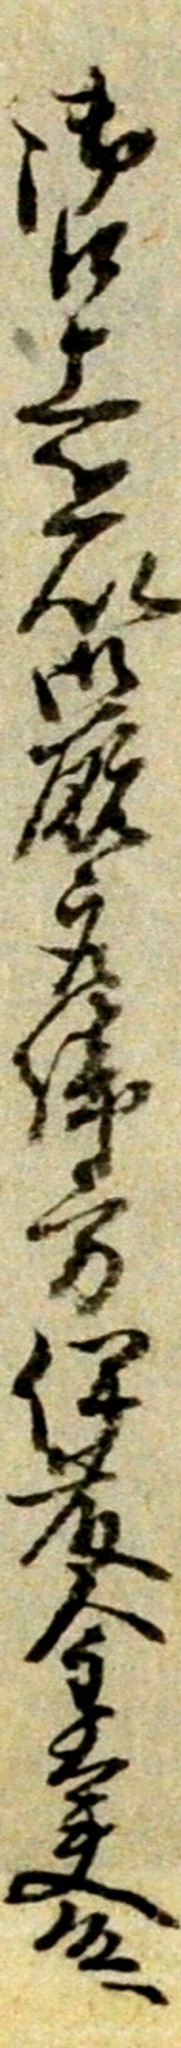御口上を以御厩取掃方伊藤金太夫殿へ
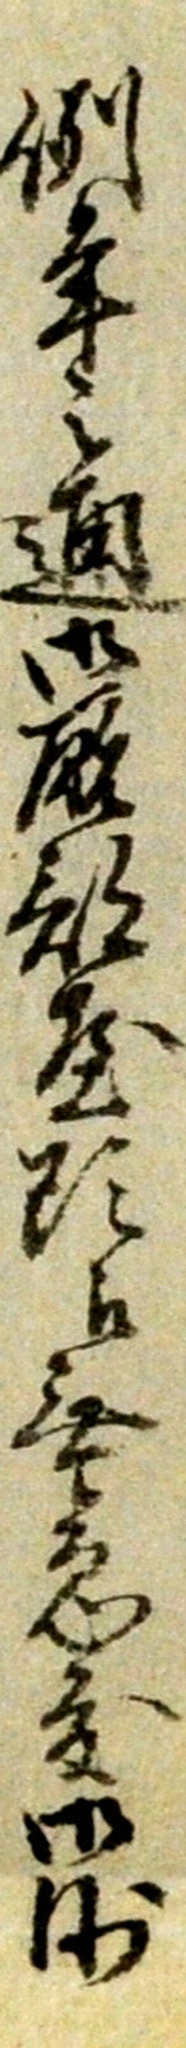例年之通御厩部屋頭江無急度御沙
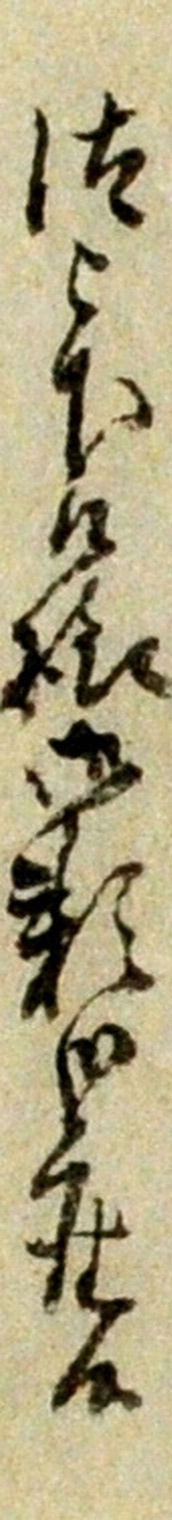汰被下候様御頼御座候
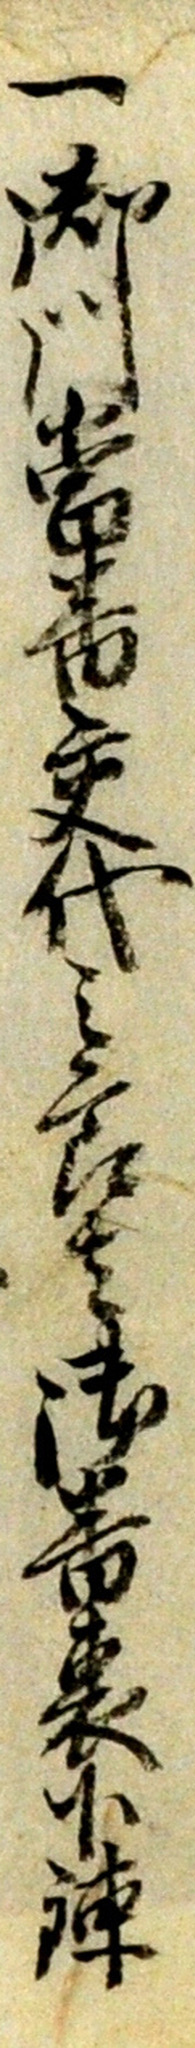一御門当番交代之節者御番裏下錬
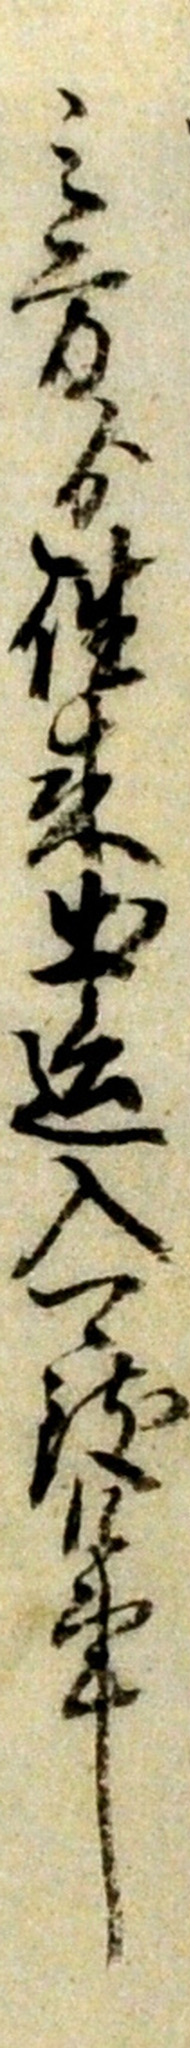之方ゟ往来出這入可致候事
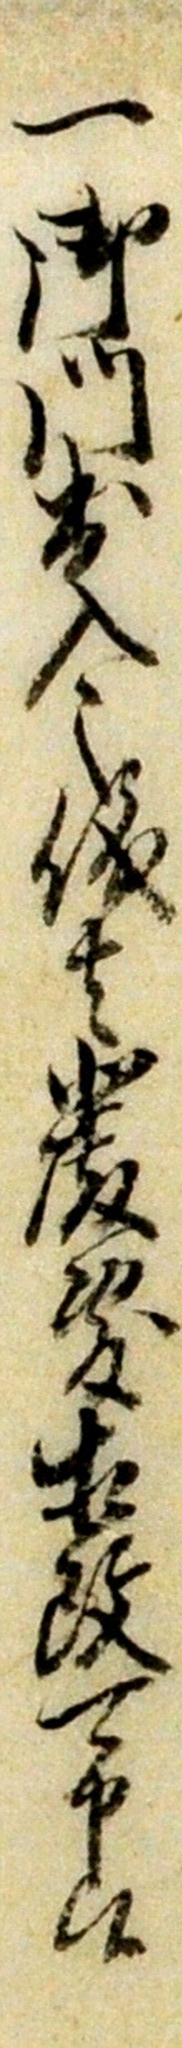一御門出入之儀者厳敷相改可申候
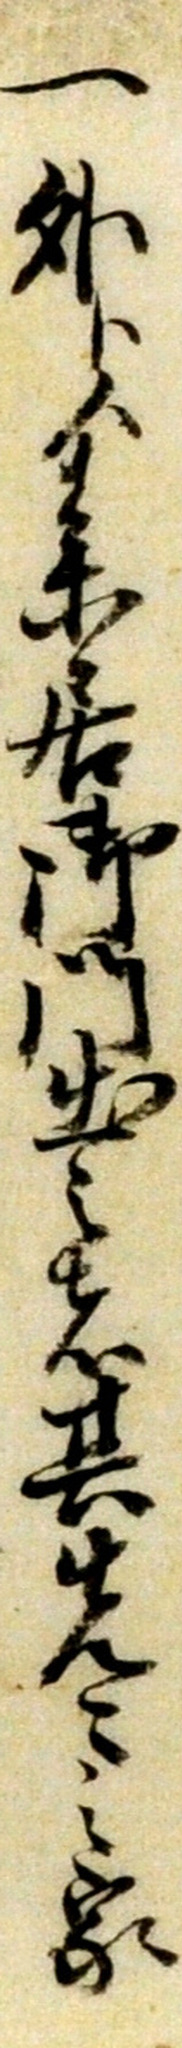一外トゟ参居御門出之者其先々之家
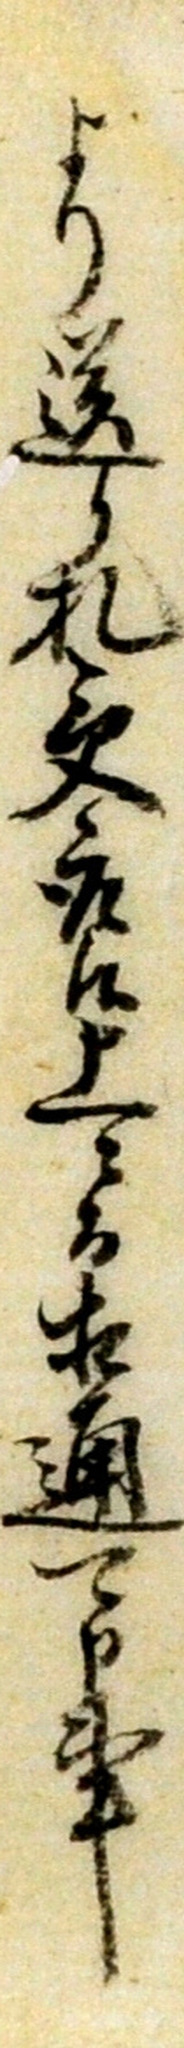より送り札受取候上ニ而相通可申事
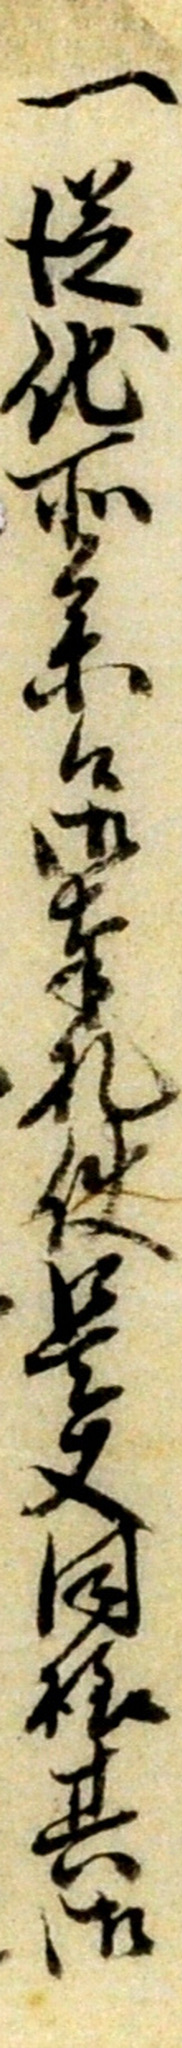一従他所参候御奉札使是又同様其御
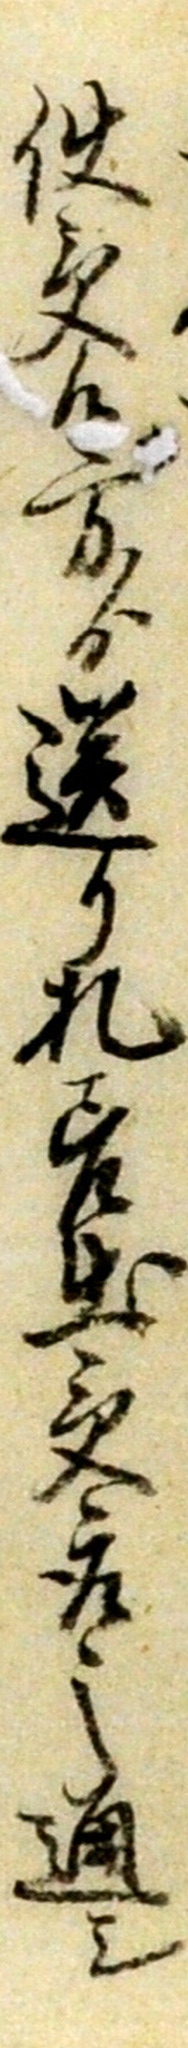使受候方ゟ送り札差出受取之通シ
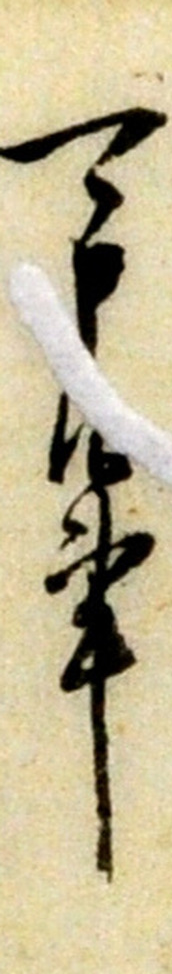可申候事
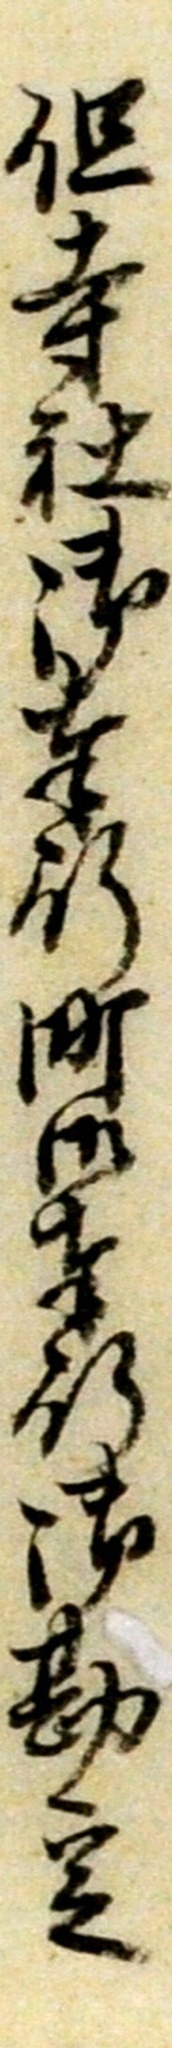但寺社御奉行町御奉行御勘定
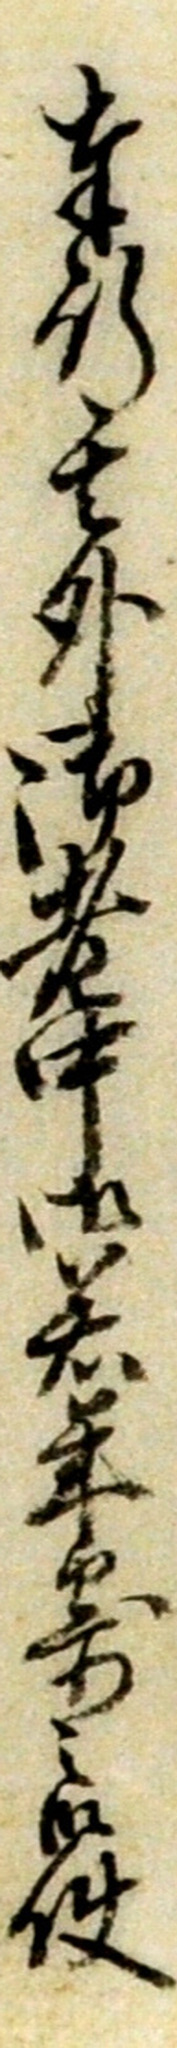奉行其外御老中御若年寄之御使
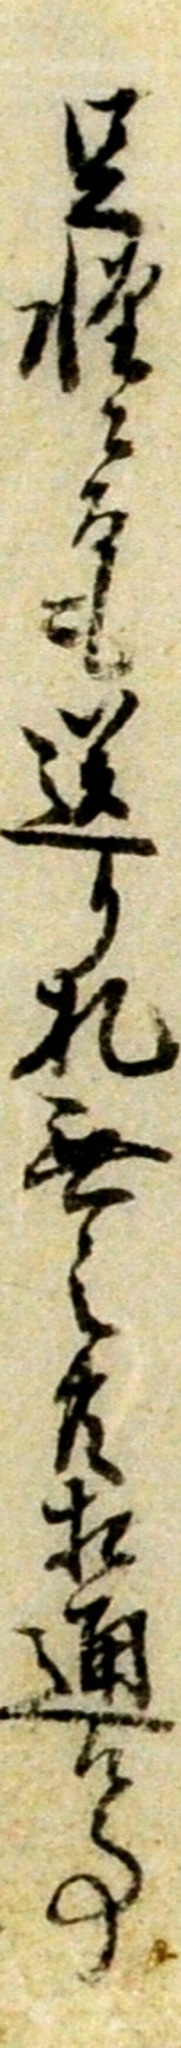足軽ニ而も送り札無之共相通候事
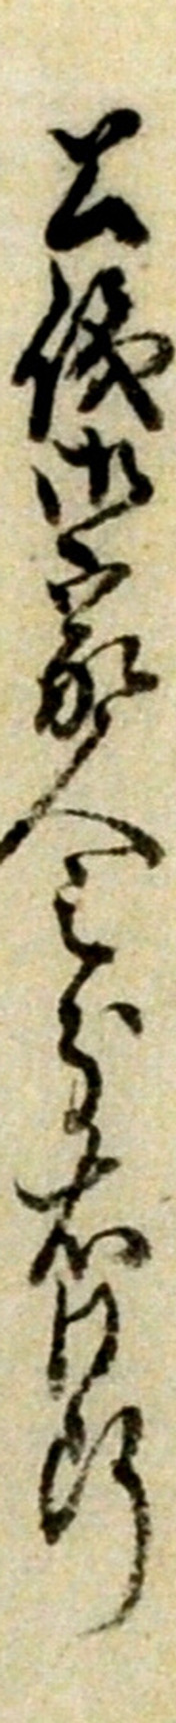公儀御家人之分右同断
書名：御先手組江戸御屋敷御門番勤方
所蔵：伊那市立高遠町図書館・合同会社AMANE
